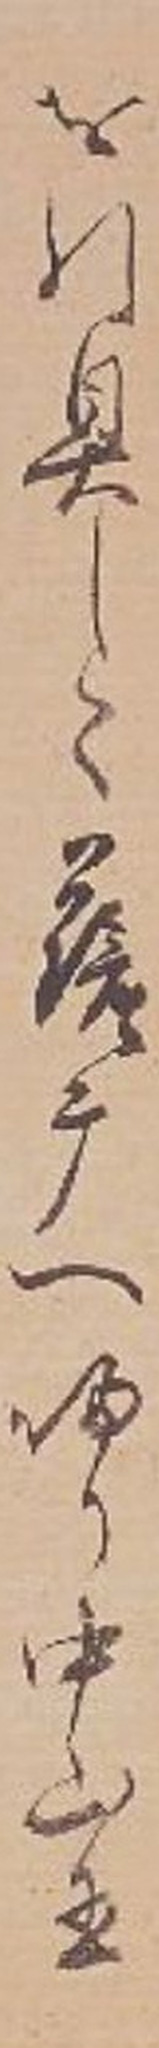を引具して薩摩へ帰り中山王
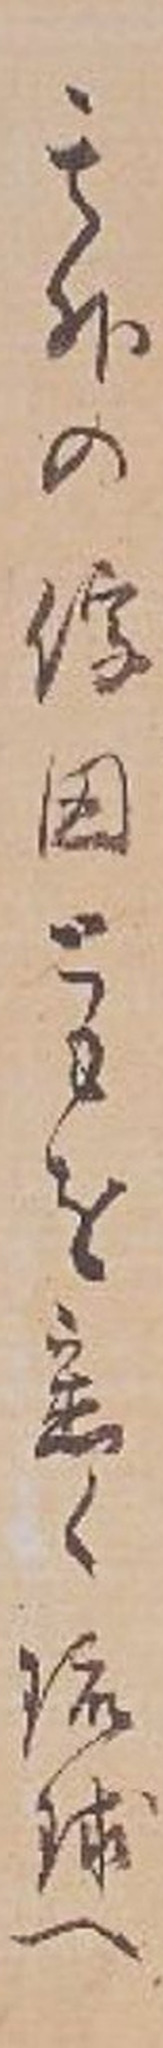其外の俘囚ともを悉く琉球へ
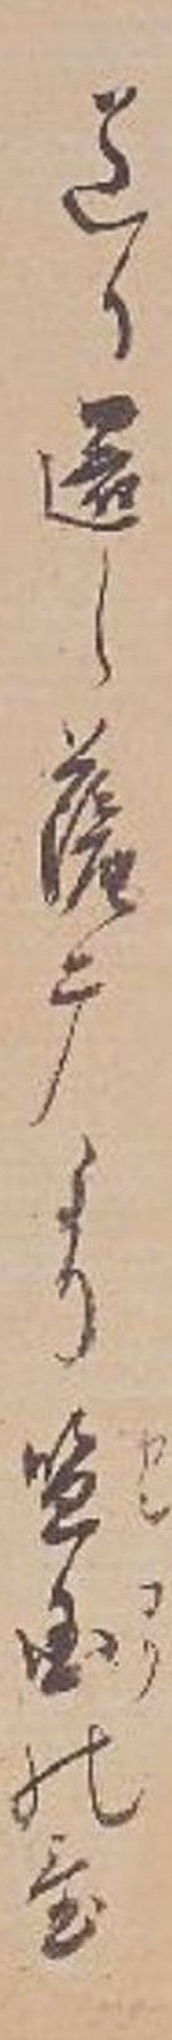送り還し薩摩より監国の置
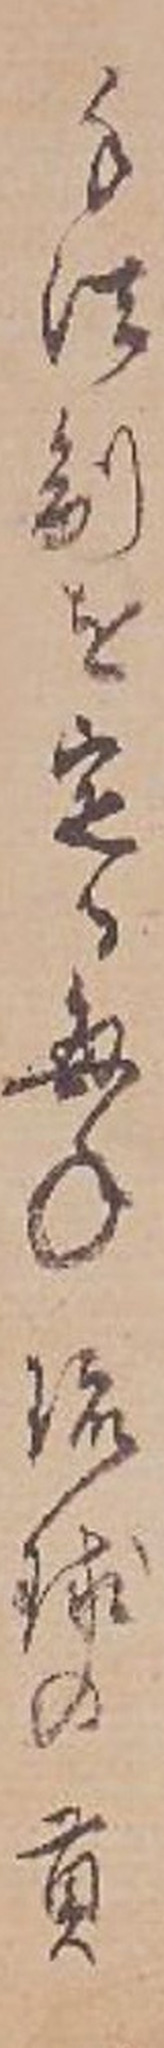手法制を定る毎年琉球の貢

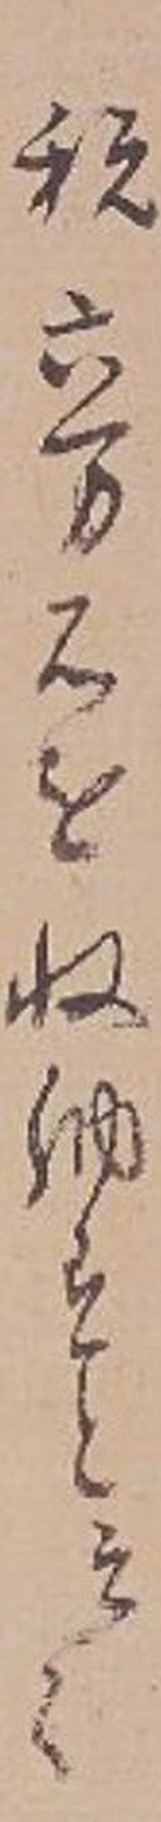税六万石を収納有と云々
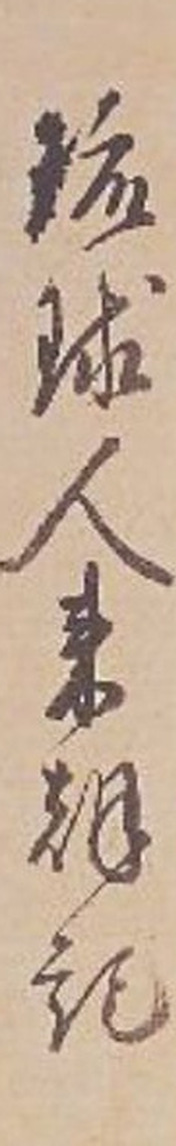琉球人来朝記
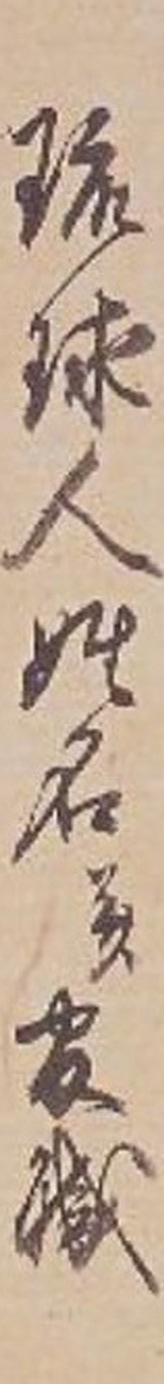琉球人姓名幷官職

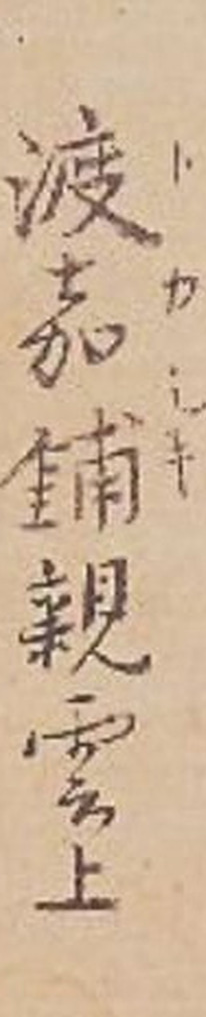渡嘉鋪親雲上
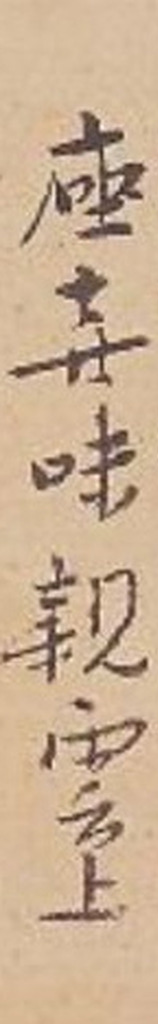座喜味親雲上
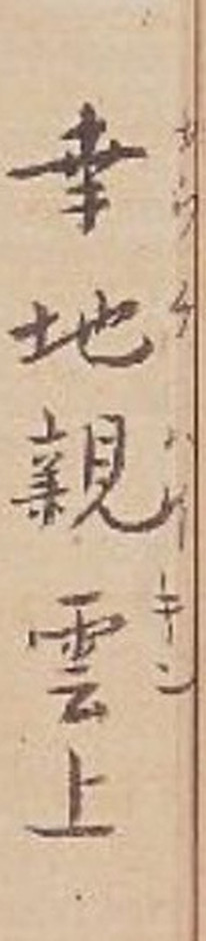幸地親雲上
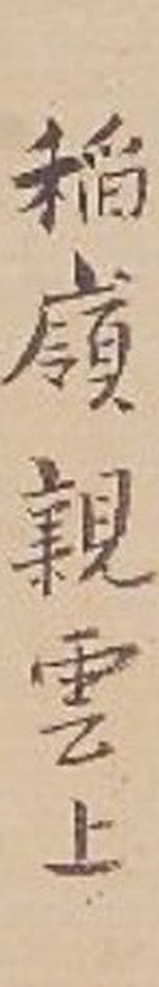稲嶺親雲上
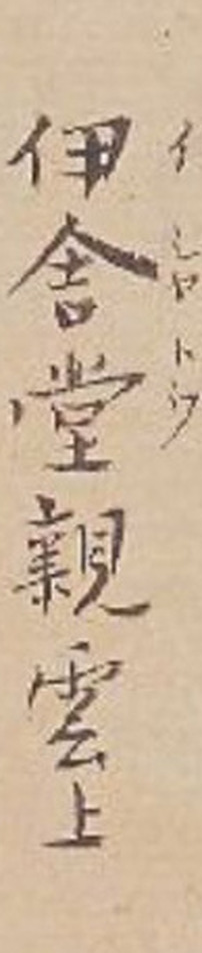伊舎堂親雲上
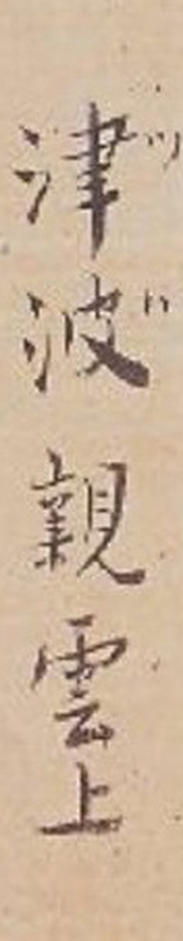津波親雲上
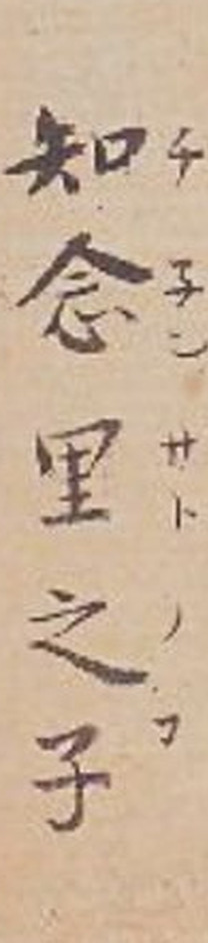知念里之子

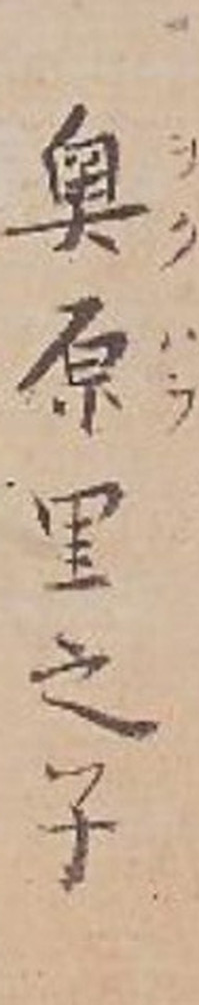奥原里之子
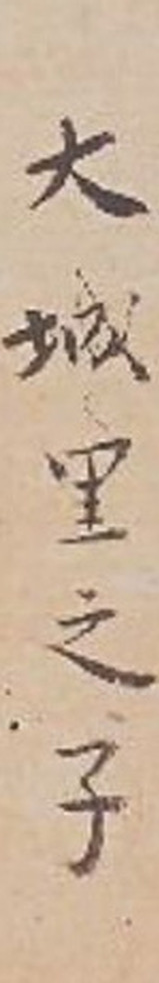大城里之子
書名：琉球人来朝記 一、二
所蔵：University of the Ryukyus Library
